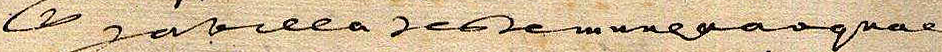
ta villa testemunha ao qual
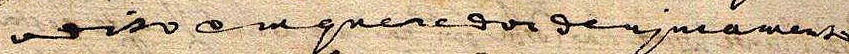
o dito emqueredor deu juramento
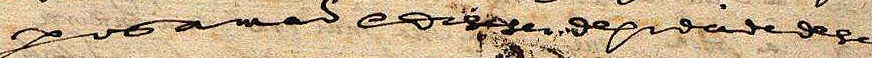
pos a maõ e dise ser de hidade de se
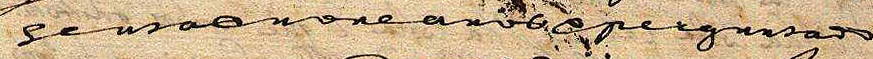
senta e noue anos e perguntado
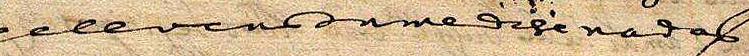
pello custume dise nada
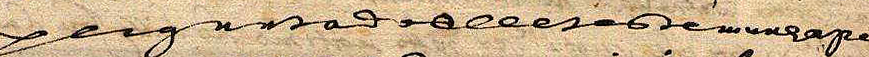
perguntado elle testemunha pe
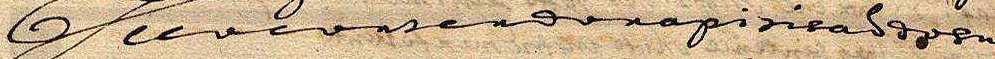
llo conteudo na pitisaõ do su
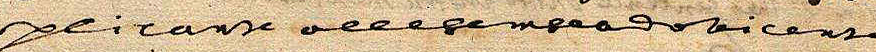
plicante o llesemseado vicente
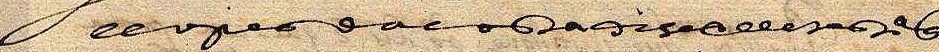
llopes da costa dise elle testa q̄
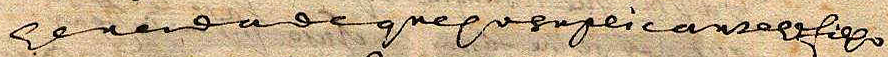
he uerdade que ho suplicante he filho
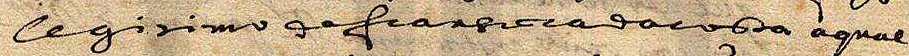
legitimo de fransisca da costa a qual
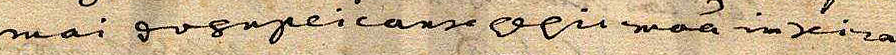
mai do suplicante he hirmaā imteira
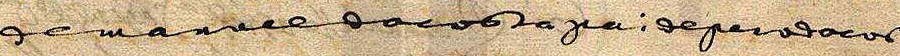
de manoel da costa pai de pero da cos
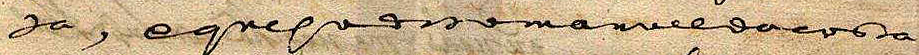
ta, e que ho dito manoel da costa
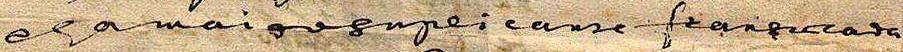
e ha mai do suplicante fransisca da
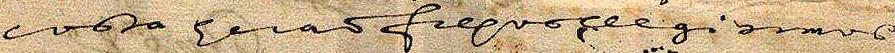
costa heraõ filhos llegitimos
